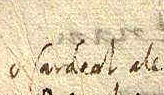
o Cardeal ale
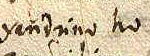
xandrino ho
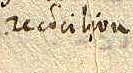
recōciliou
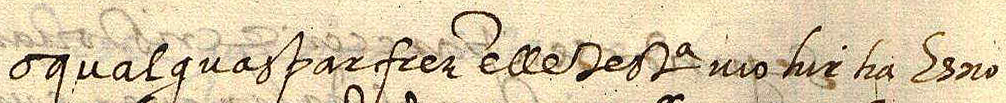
o qual guaspar frez̄ elle testa uio hir ha Esno
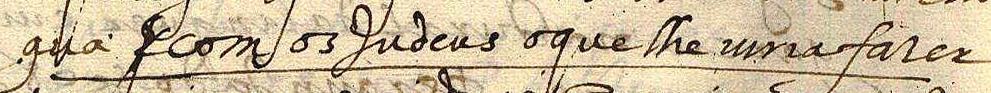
gua E com os Judeus o que lhe uiria fazer
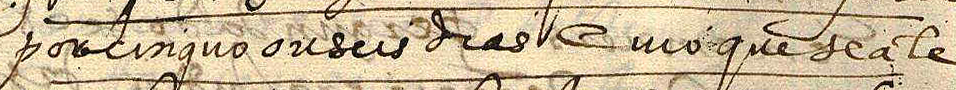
por cinquo ou seis dias E uio que se ale
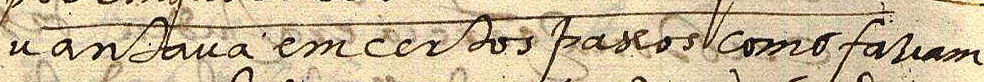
uantaua em certos passos como faziam
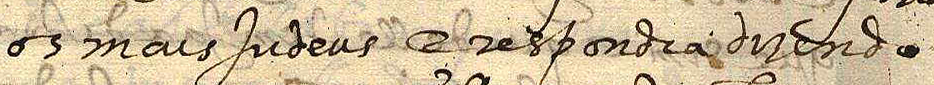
os mais Judeus e respondia dizendo
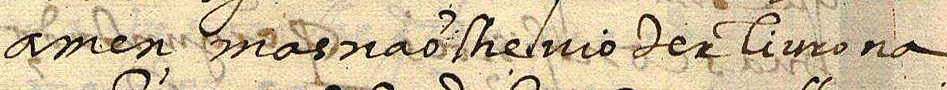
amen mas naõ lhe uio ter liuro na
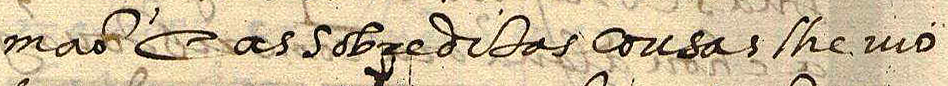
maõ E as sobreditas cousas lhe uio
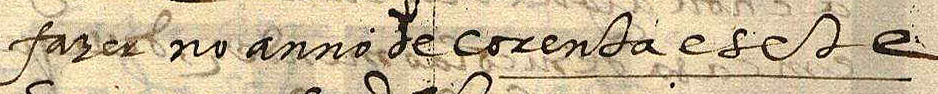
fazer no anno de corenta e sete
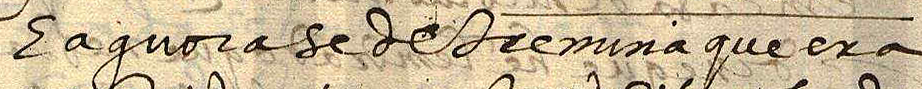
E aguora se detremina que era
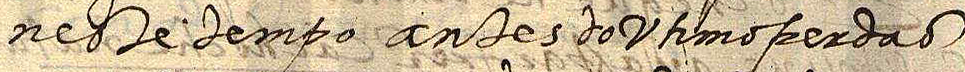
neste tempo antes do Vtimo perdaõ
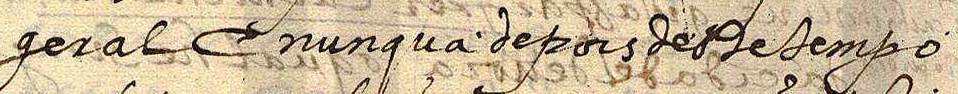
geral e nunqua depois deste tempo
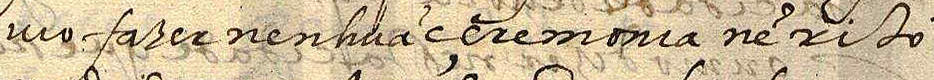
uio fazer nenhuā çeremonia nē rito
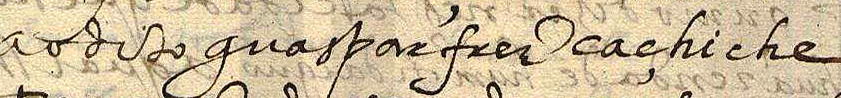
ao dito guaspar frez̄ cachiche
